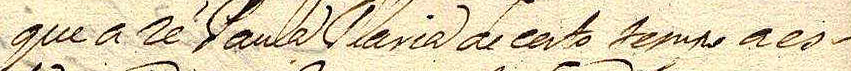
que a Ré Paula Maria de certo tempo a es
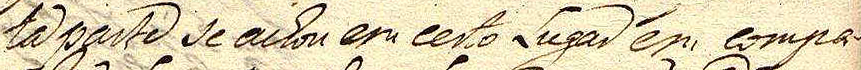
ta parte se achou em certo Lugar em compa
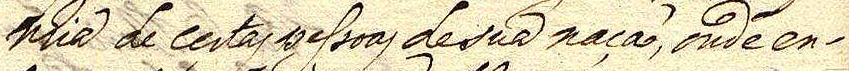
nhia de certas pessoas de sua naçaõ, onde en
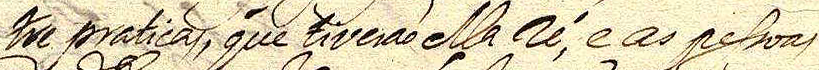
tre praticas, que tiveraõ ella Ré, e as pessoas
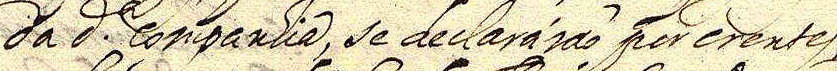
da d.a companhia, se declaráraõ per crentes,
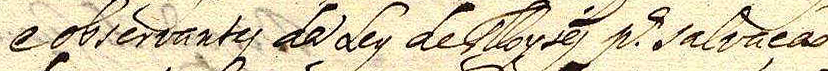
e observantes da Ley de Moyzés, p.a salvaçaõ
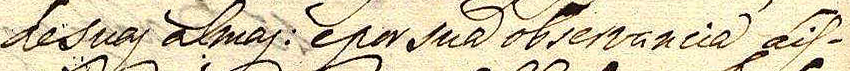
de suas almas: e por sua observancia dis
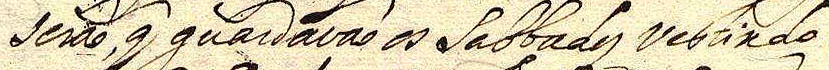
seraõ, q̄ guardavaõ os Sabbados vestindo
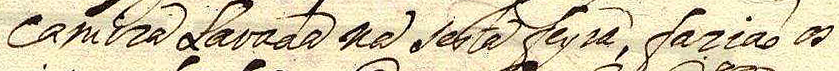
camiza Lavada na sesta feyra, faziaõ os
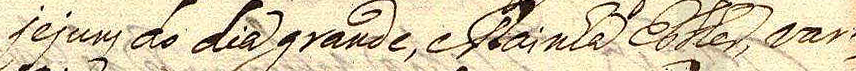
jejuns do dia grande, e Rainha Esther, var
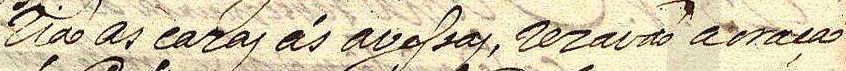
riaõ as cazas ás avessas, rezavaõ a oração
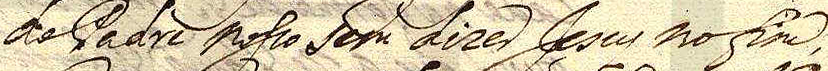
do Padre nosso sem dizer Jesus no fim,
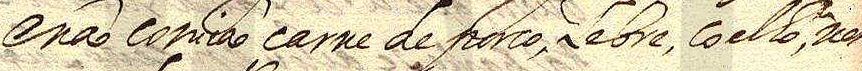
e não comiaõ carne de porco, Lebre, coelho nem
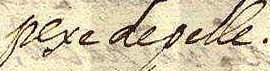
pexe de pelle.
